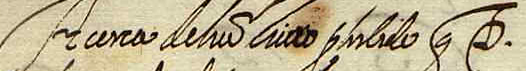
Acerca de hū liuro ꝓhibido q̄ D.
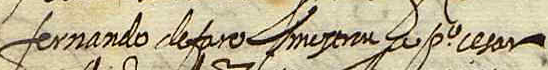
fernando de faro mostrou a p.o cesar
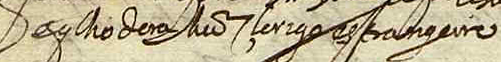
e q̄ lho dera hū Clerigo estrangeiro
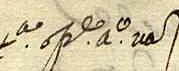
ta. o p.e a.o uaz
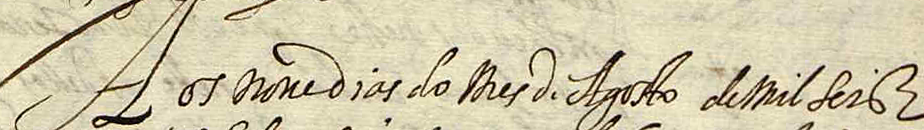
Aos noue dias do Mes de Agosto de mil seis
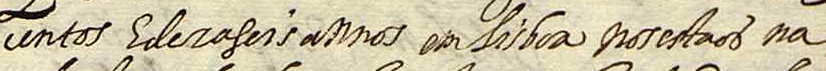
centos E dezaseis annos em Lisboa nos estaos na
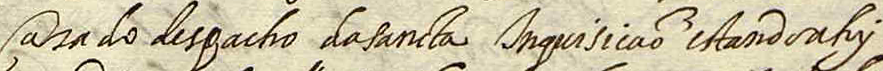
Caza do despacho da sancta Inquisiçaõ estando ahy
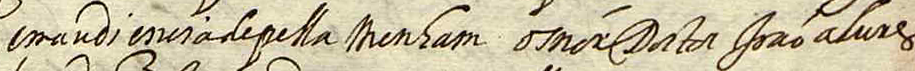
em audiencia de pella menham o snor̄ Doctor Joaõ alures
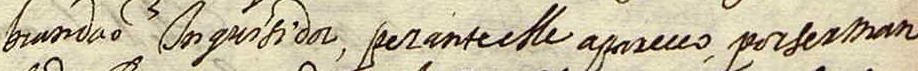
brandaõ Inquisidor, perante elle apareceo, por ser man
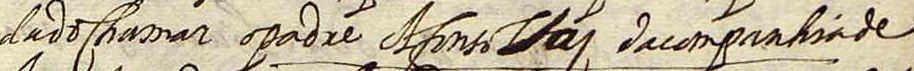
dado Chamar o padre Afonso Vaz da companhia de
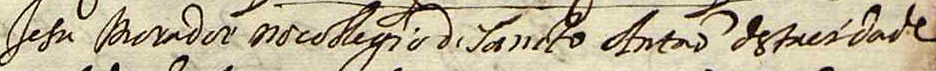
Jesu morador no collegio de Sancto Antaõ desta cidade
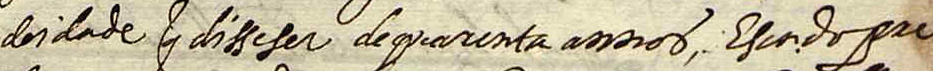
de idade q̄ disse ser de quarenta annos, E sendo pre
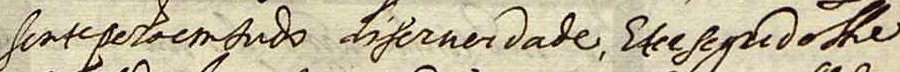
sente pera em tudo diser uerdade, E ter segredo lhe
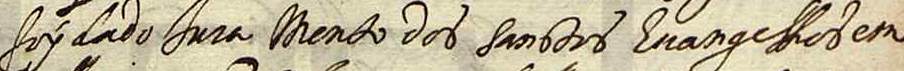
foy dado Juramento dos sanctos Euangelhos em
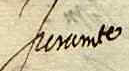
Juramto
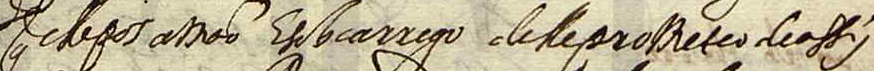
q̄ elle pos a maõ E sob carrego delle prometeo de assy
